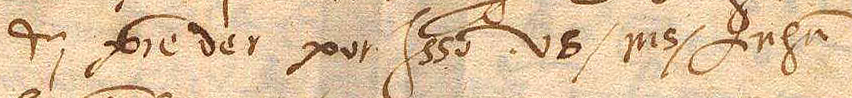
de prēder por Jsso vs / ms / tenhā
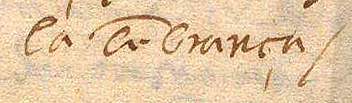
la lēbrança /
